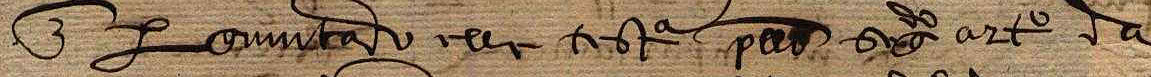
item ꝑgumtado elle testa p̄llo segdo arto da
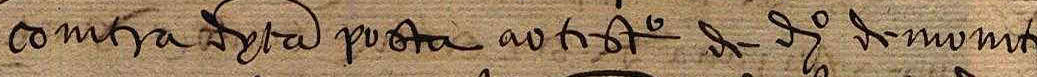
comtradyta posta ao testo de djo de momt
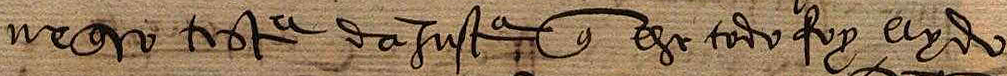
negro testa da Justa q̄ lhe todo foy llydo
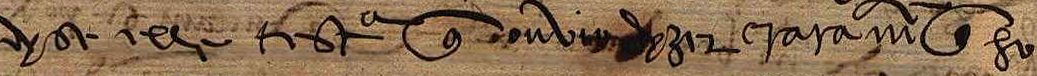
dyse elle testa q̄ ouvio dyzer craramte q̄ ho
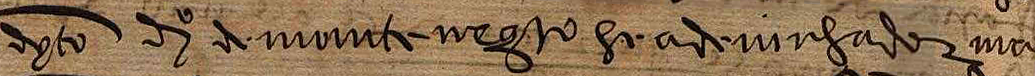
dyto djo de montenegro he adeuinhador ma
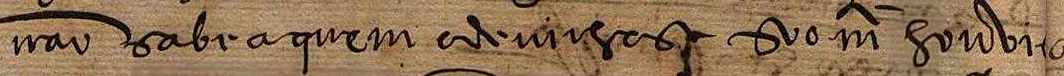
não sabe a quem adeuinhase soomte houvi
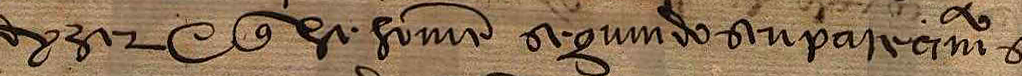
dyzer e q̄ he homē segumdo seu parecimto s
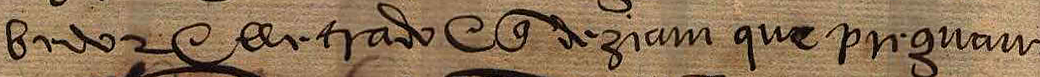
bedor e lletrado e q̄ deziam que preguaua
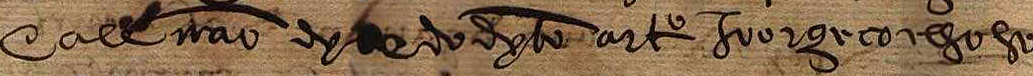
e all não dyse do dyto arto Joorge coelho ho
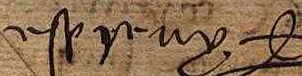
espreuy
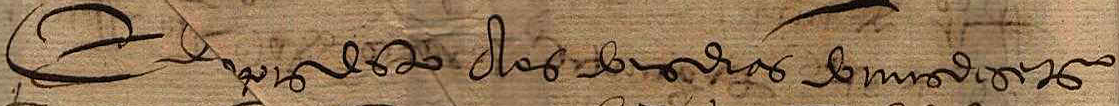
E dpois desto Aos dous dias do mes de setro
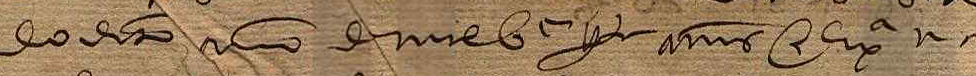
do dito ano de mil bc Rta an̄os ē lixa na
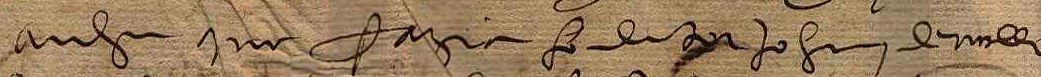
audja que fazia ho doutor Joham de mello
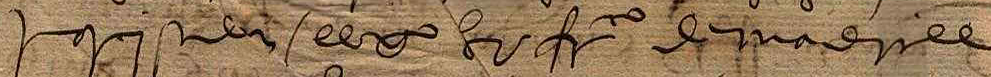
Jnqujsidor / llogo hi frco de madrill
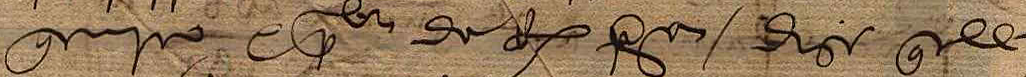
genrro e p̄dor da Rꝭ p̄sa / dise q̄ elle
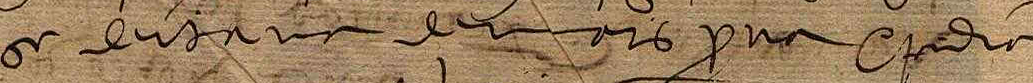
se deitaua de mais ꝓua e pedia
